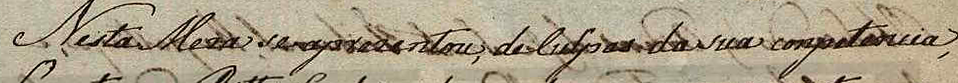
Nesta Meza se aprezentou, de Culpas da sua competencia,
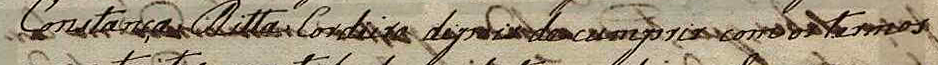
Constança Ritta Cordeiro depois de cumprir com os termos
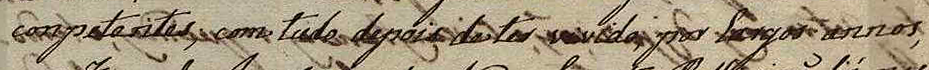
conpetentes; comtudo depois de ter vivido por largos annos
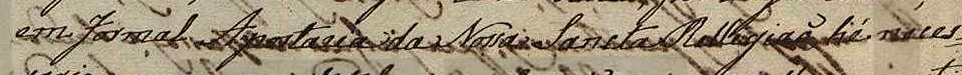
em formal Apostazia da Nossa Sancta Relligiaõ hé neces
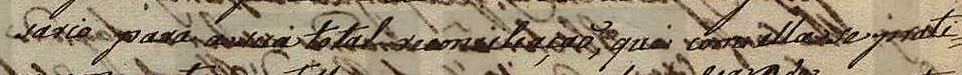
sario para a sua total reconciliaçaõ, que com ella se prati
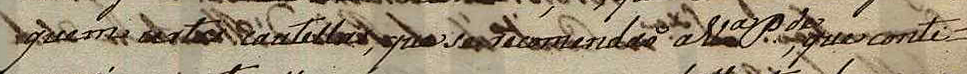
quem estas cautellas, que se recomendaõ a V.a P.de, que conti
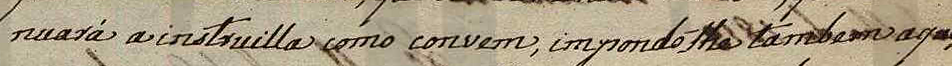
nuará a instruilla como convem, impondolhe tambem aque
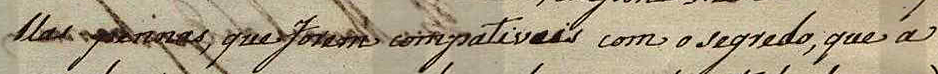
llas pennas, que forem compativeis com o segredo, que a
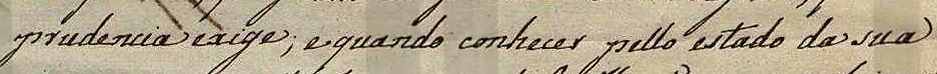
prudencia exige; e quando conhecer pello estado da sua
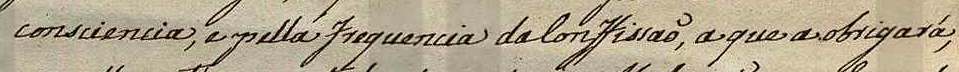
consciencia, e pella frequencia da Conffissaõ, a que a obrigará,
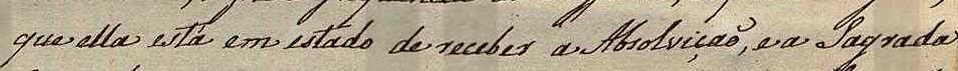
que ella está em estado de receber a Absolviçaõ, e a Sagrada
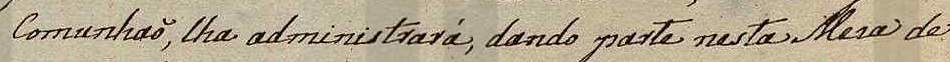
Comunhaõ, lha administrará, dando parte nesta Meza de
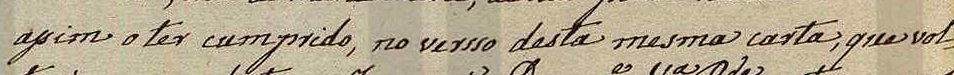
assim o ter cumprido, no versso desta mesma carta, que vol
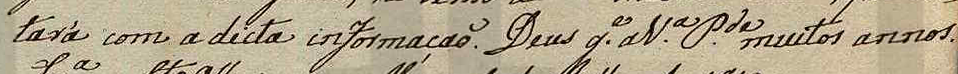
tará com a dicta informaçaõ. Deus g.e a V.a P.de muitos annos.
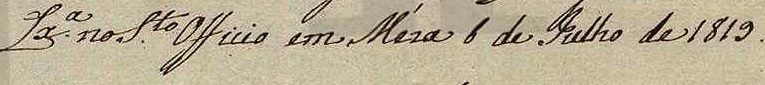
Lx.a no S.to Officio em Meza 6 de Iulho de 1819.
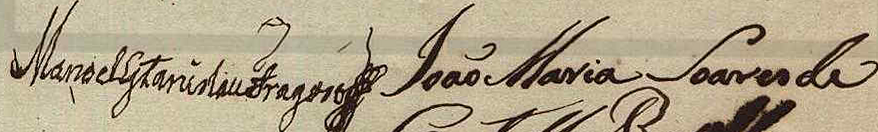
Manoel Estanislau Fragoso Ioaõ Maria Soares de
